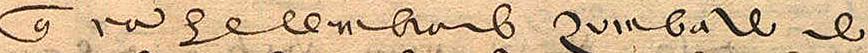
q̄ nā he lembrado zombādo do
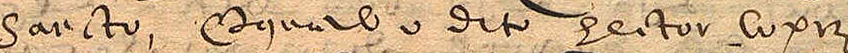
Sancto, E quādo o dito hector lopez
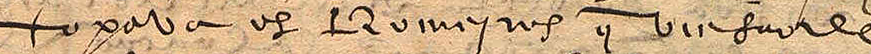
topava os Romejros q̄ vinhaõo de
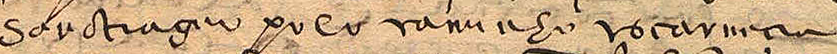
Sanctiaguo pelo caminho escarneçia
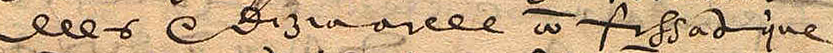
delles e dizia a elle cōfessante que
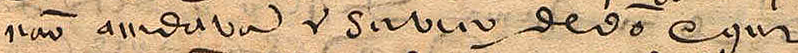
não amdavā ē serviço de ds̄ e que
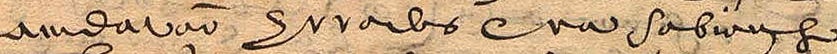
amdavaõ hrrados e nā sabiam ho
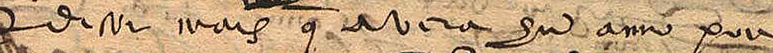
E disse mais q̄ avera hū anno pou
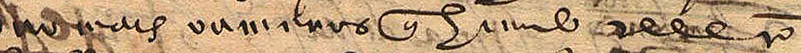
Quo mais ou menos q̄ himdo elle cō
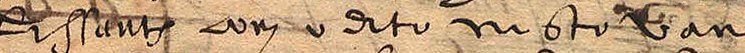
fessantꝭ com o dito cristovan
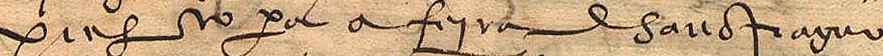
pinhro ꝑa a fejra de Sanctiaguo
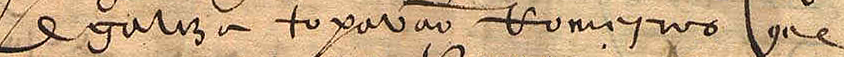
d galiza topavão Romejros que
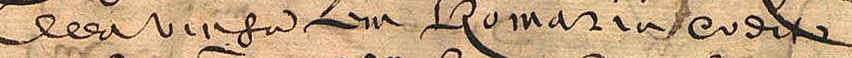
della vinhā em Romaria e o dito
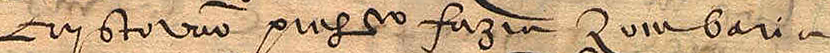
crystovão pinhro fazia zombaria
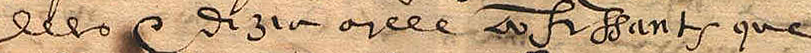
delles e dizia a elle cōfessantꝭ que
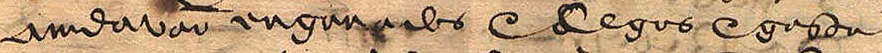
amdavão enganados e Cegos e gastā
